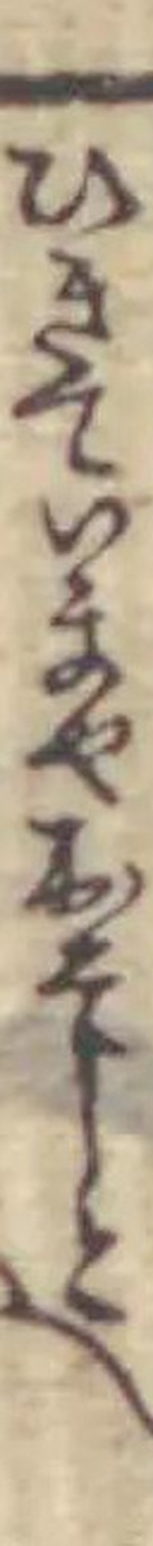ひきていまやおそしと
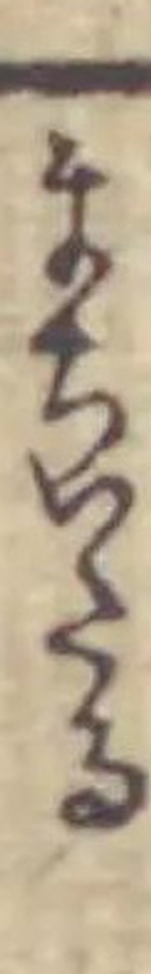まちいたる
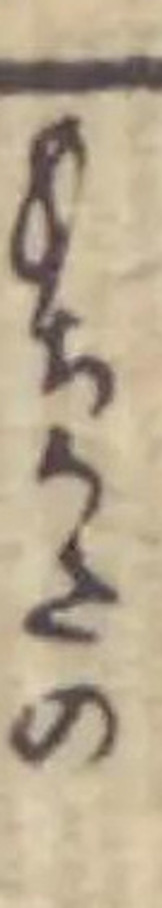もちかたの
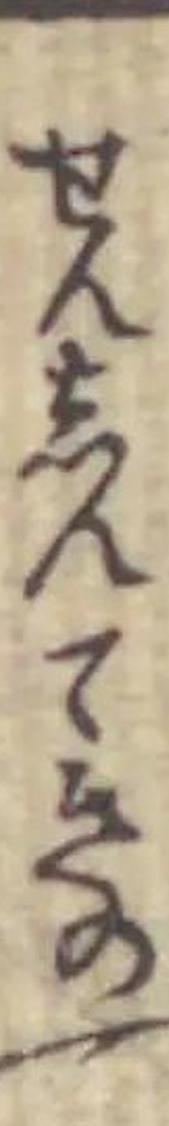せんしんてきの
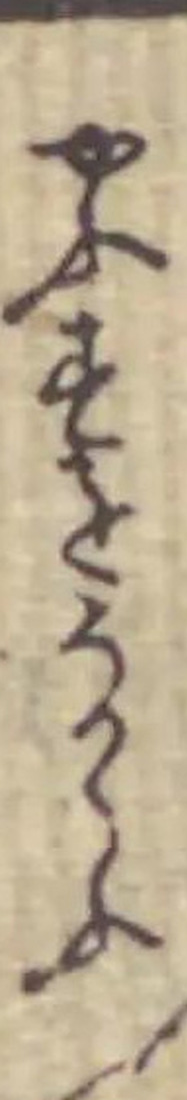やふすをうかゝふ
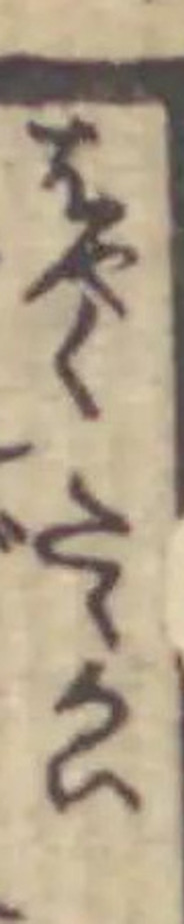はや〳〵たゝかい
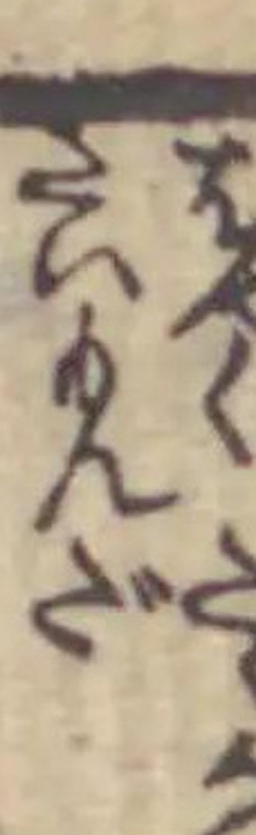たいもんだ

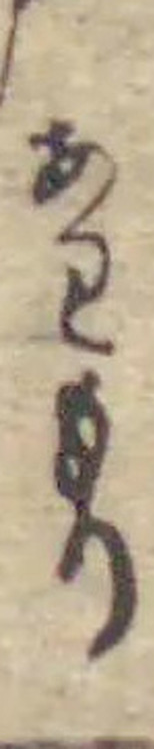あわもり
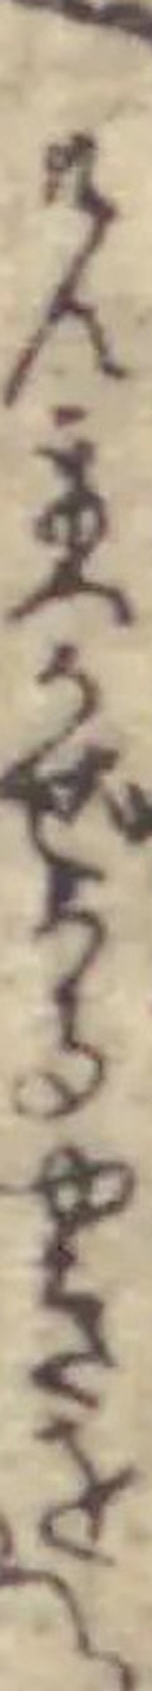けんまへかぜかるやきを
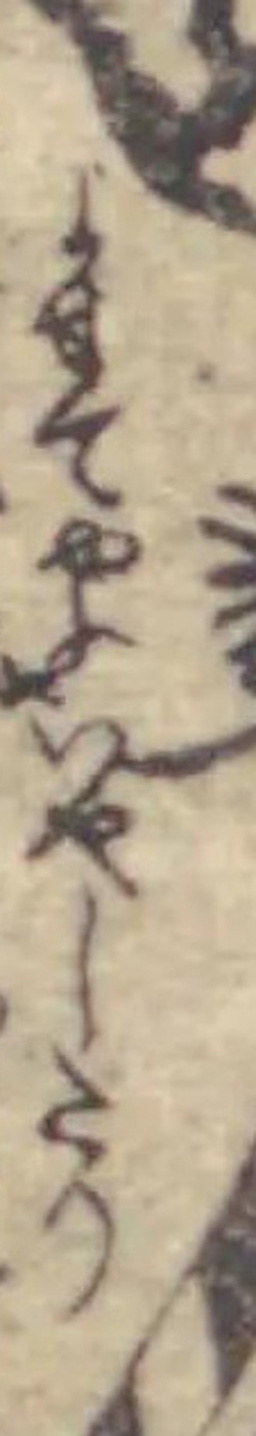よせてやふいやしたり
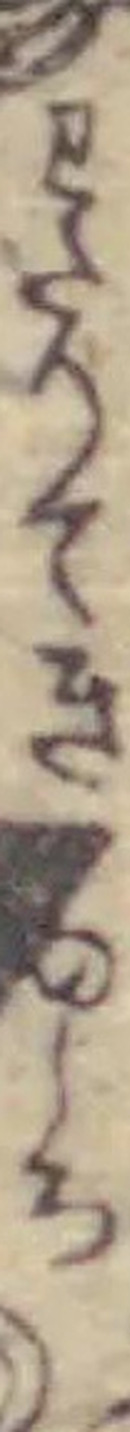わたりてきのしろ
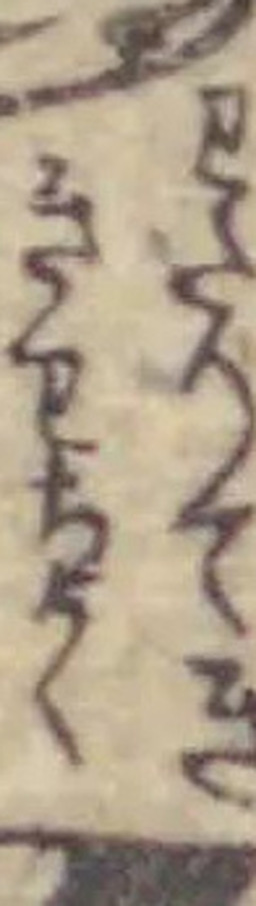きわちよく
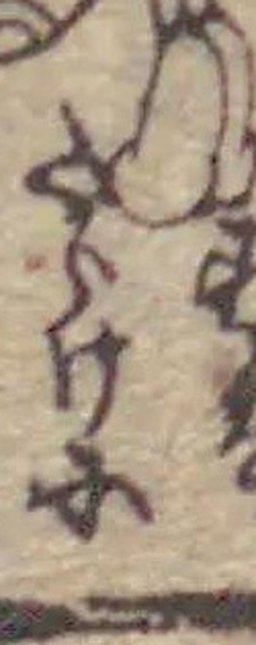たらけに
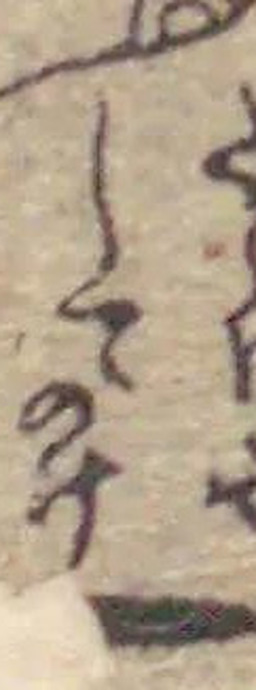してのけ
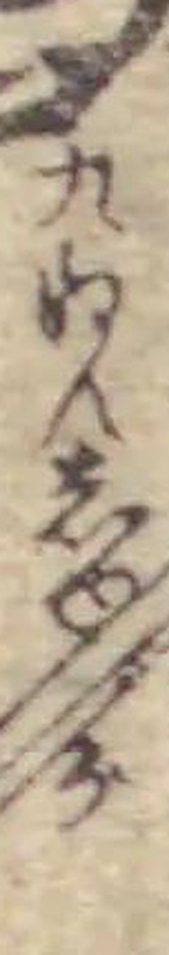九ねんしゆが
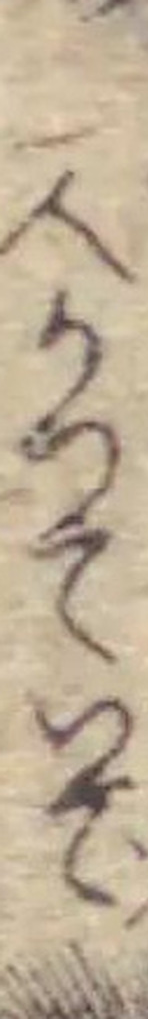二人うつていで
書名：餅酒腹中能同志 2巻
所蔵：国立国会図書館 National Diet Library, JAPAN
